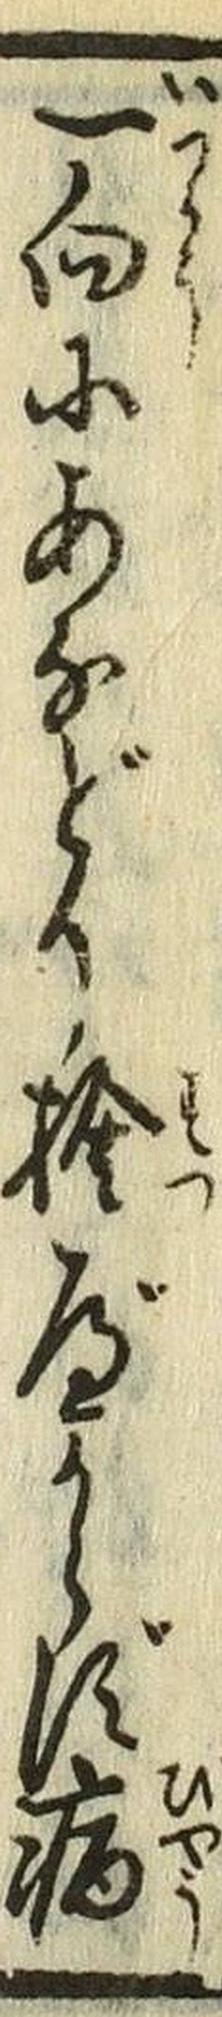一向にあなどり捨べからず病
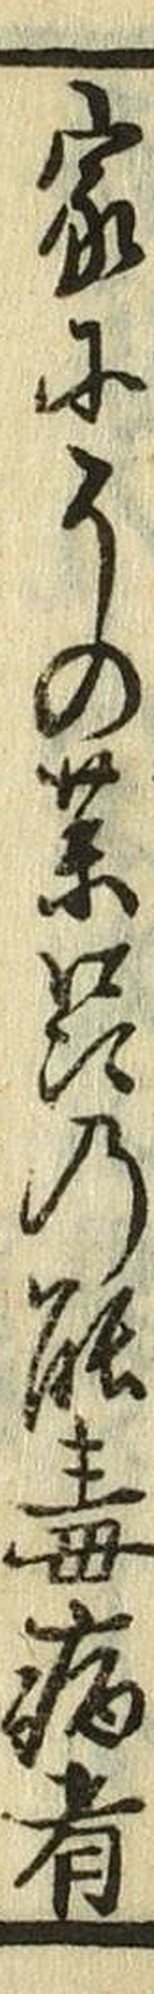家にその薬品の能毒病者
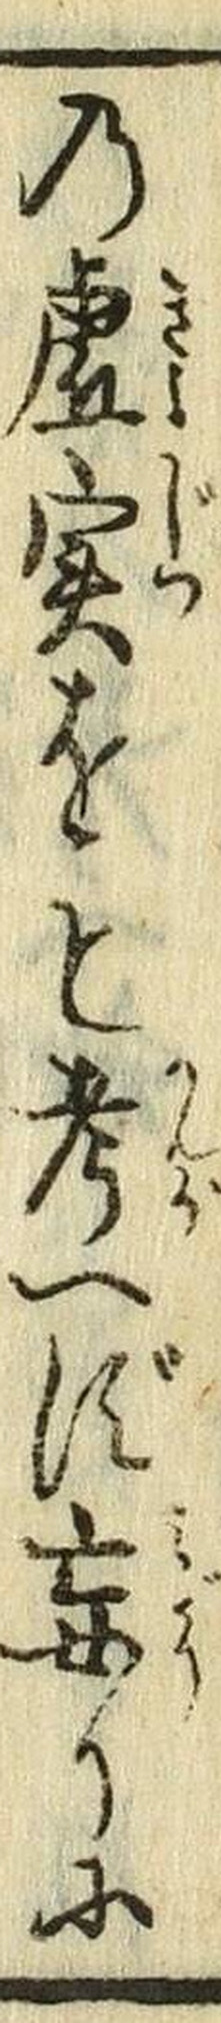の虚実をも考へず妄に
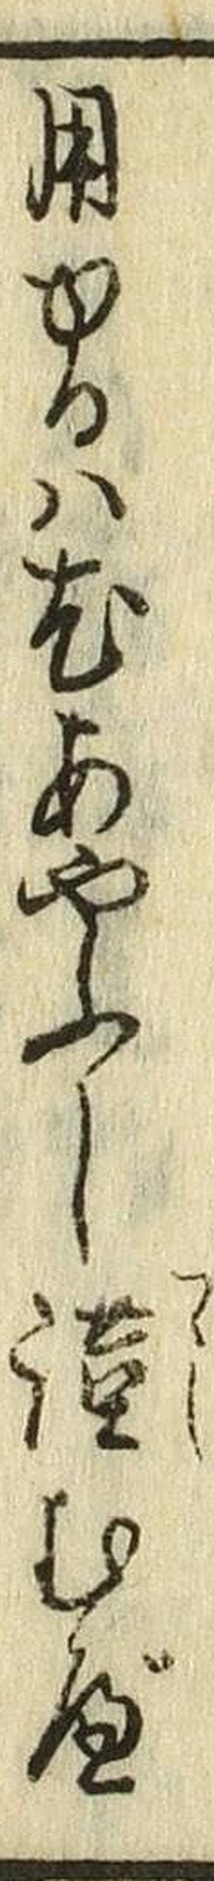用ゆるは尤あやふし謹むべ
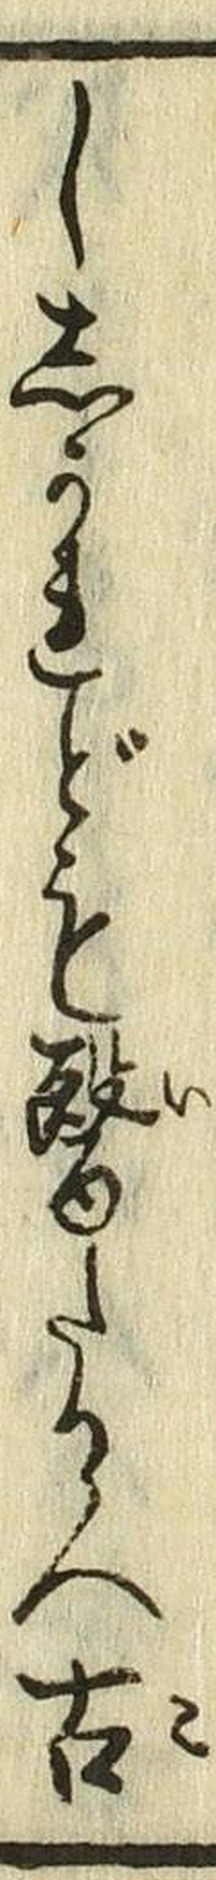ししかれども医たる人古
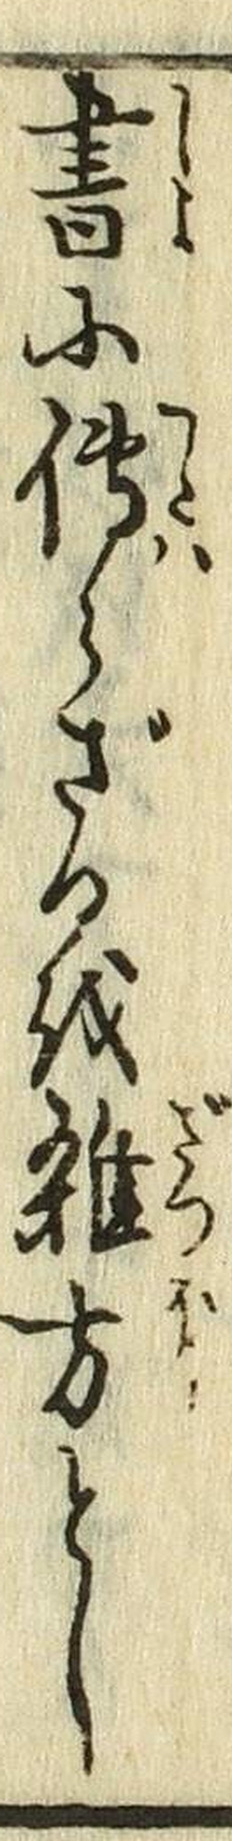書に伝らざるを雑方とし
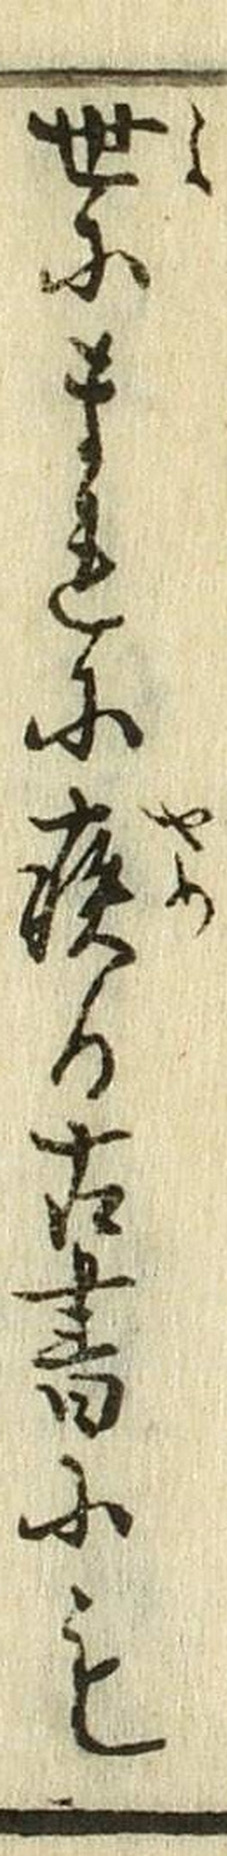世にまれに疾る古書にも
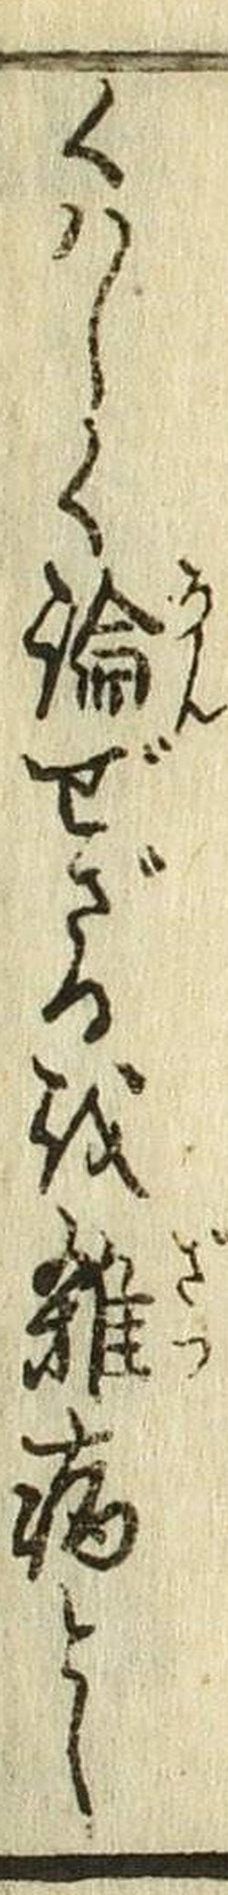くはしく論ぜざるを雑病とし
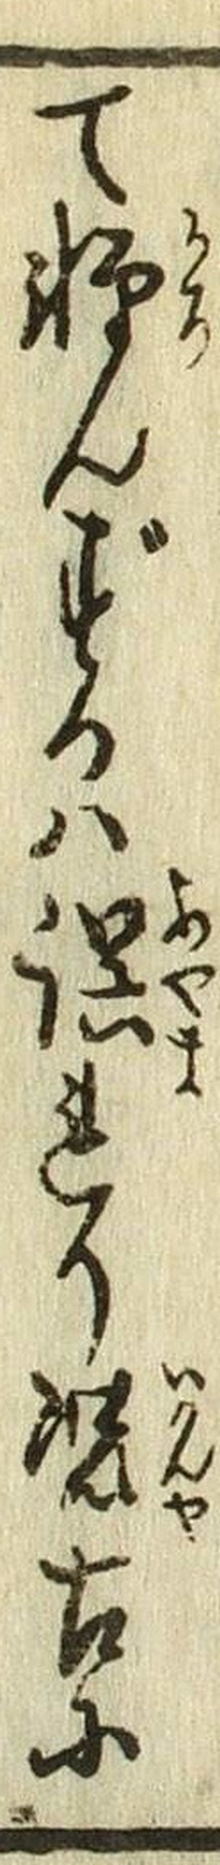て軽んずるは誤れり況古に
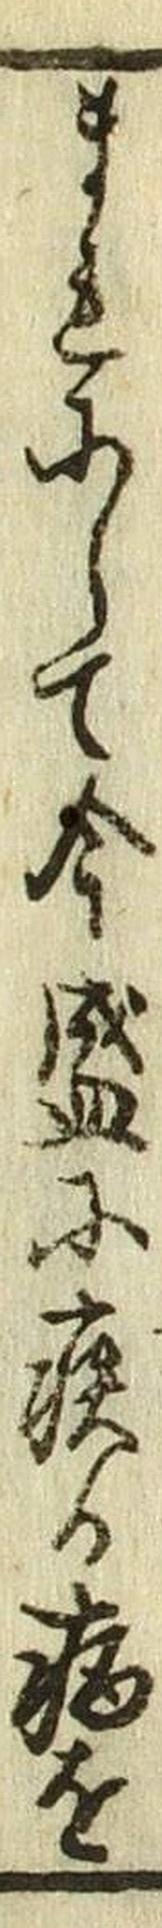まれにして今盛に疾る病を
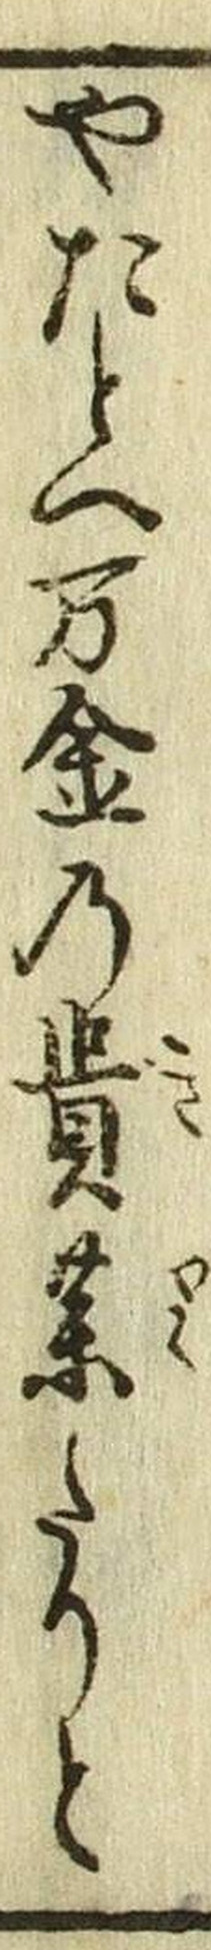やたとへ万金の貴薬たりと
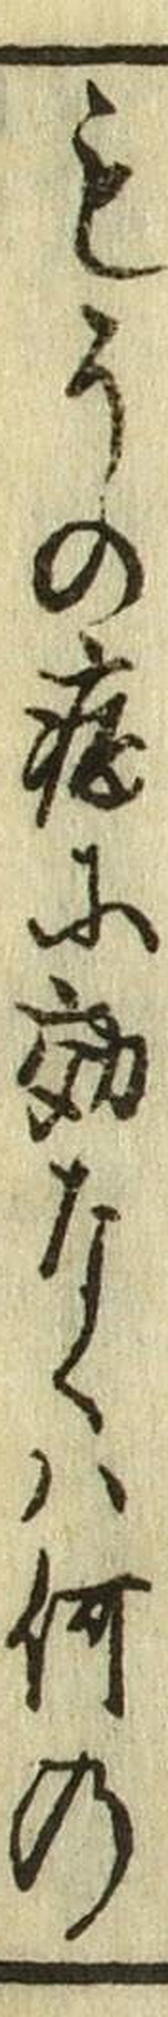もその病に効なくは何の

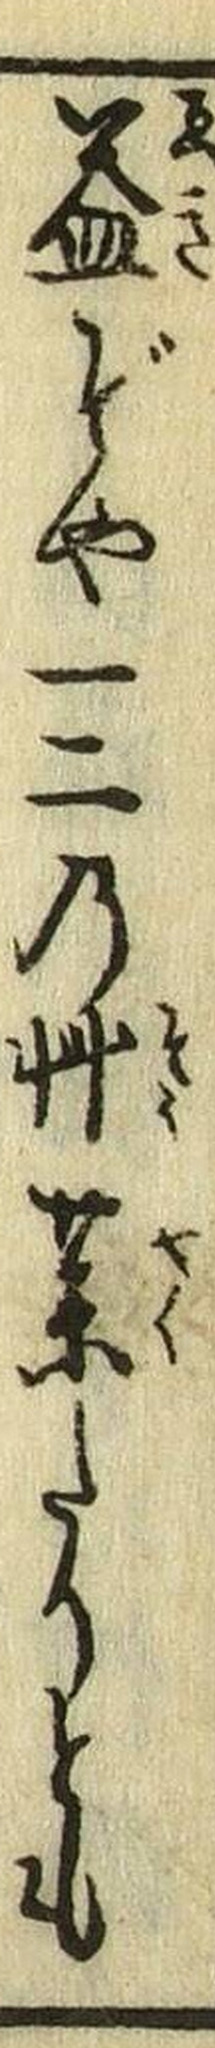益ぞや一二の草薬たりとも
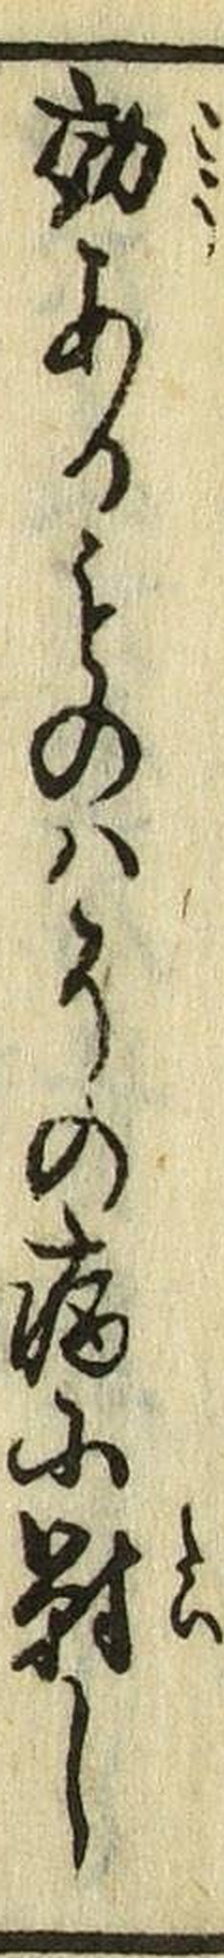効あるものはその病に対し
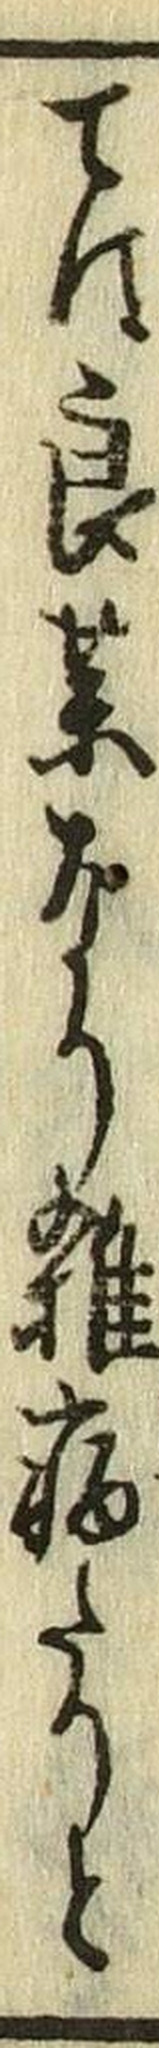ては良薬なり雑病たりと
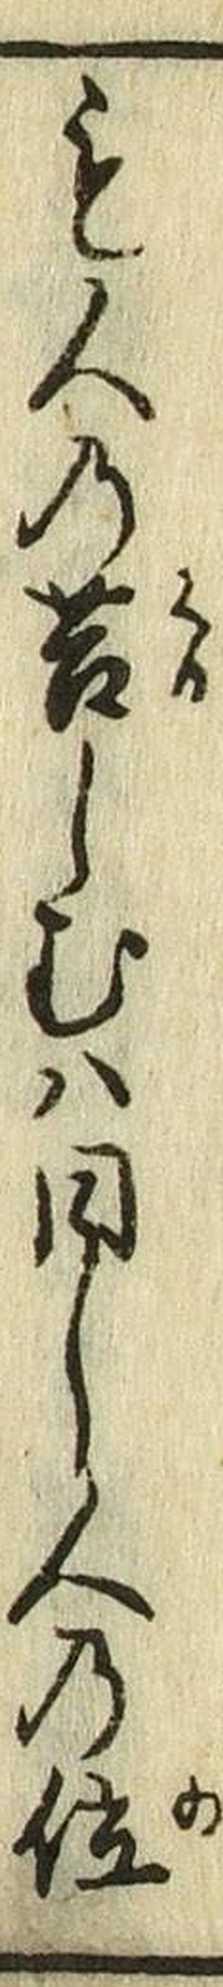も人の苦しむは同し人の位
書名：居家養生記
